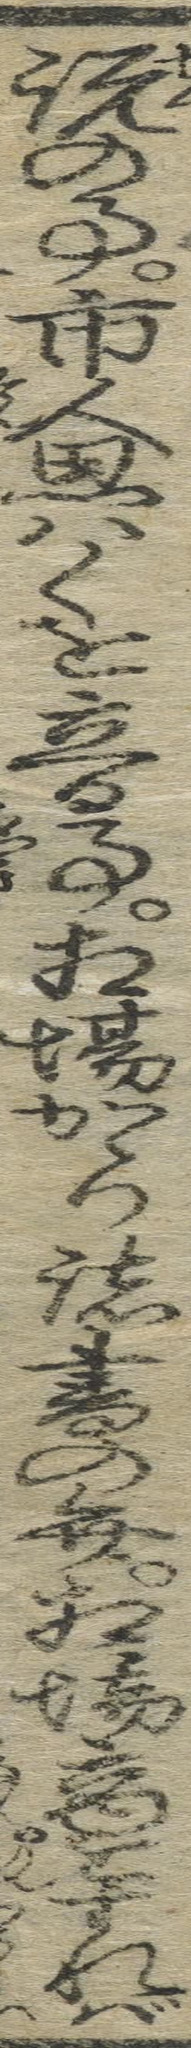説の事。市人思はくを立る事。相場から諸書の弁。相場商をすれば
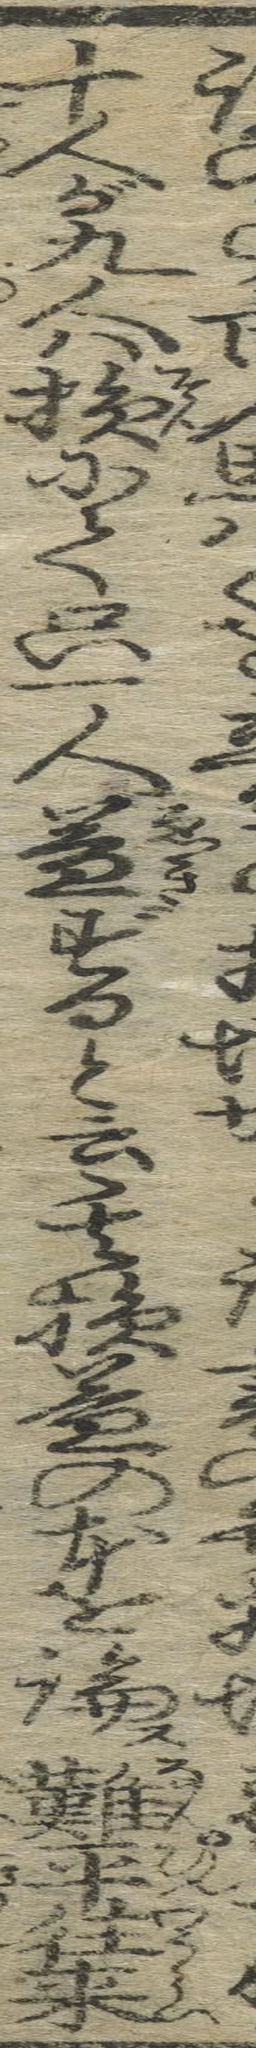十人が九人は損にて只一人益ずると云其損益の本を論難平往来
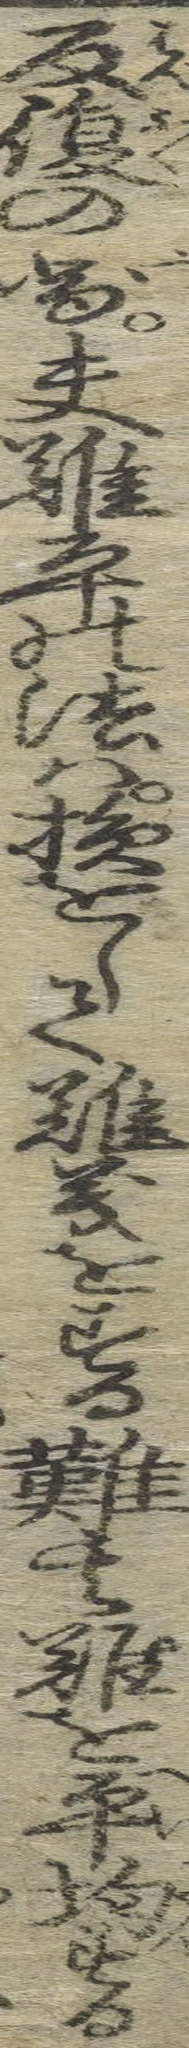反復の図。夫難平の法は。損をして難義をする難其難を平均する
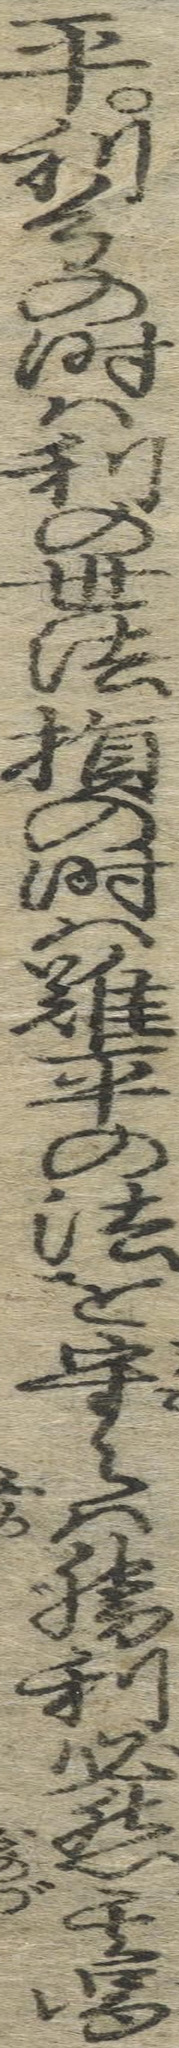平。利分の時は利の世法損の時は難平の法を守らは勝利必然。其図
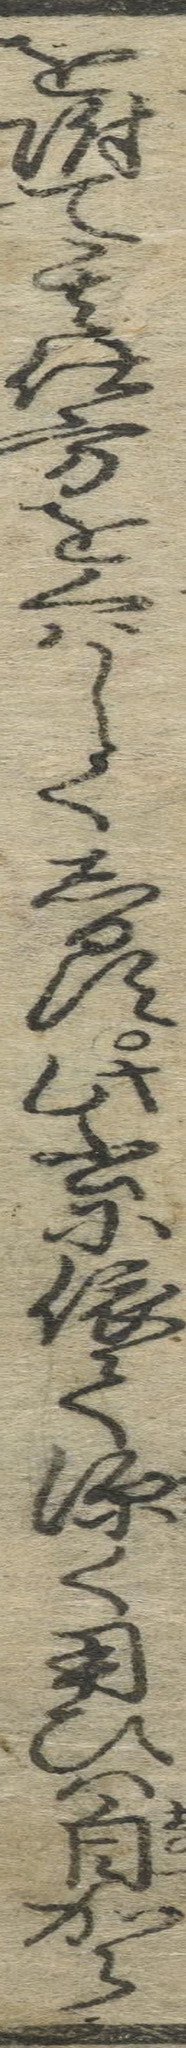を附て其仕方をくはしくしるす。此書に依て深く用ひは自から
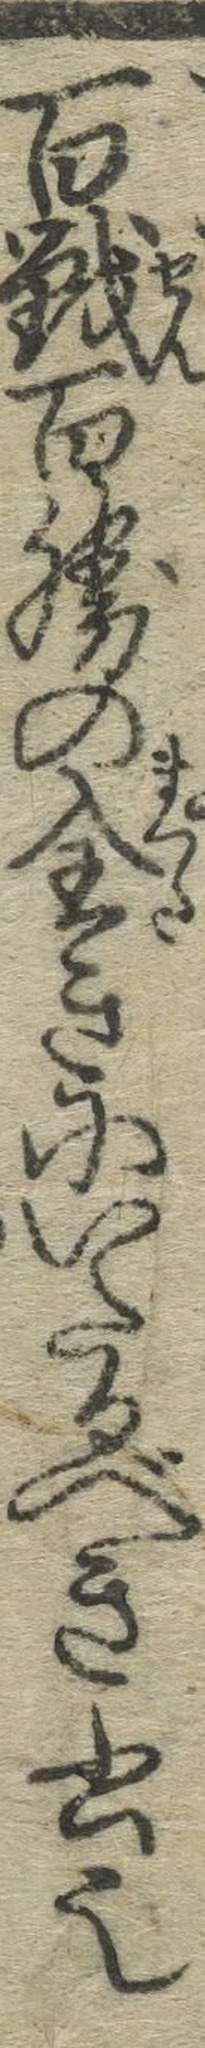百戦百勝の全きにいたるべき書也
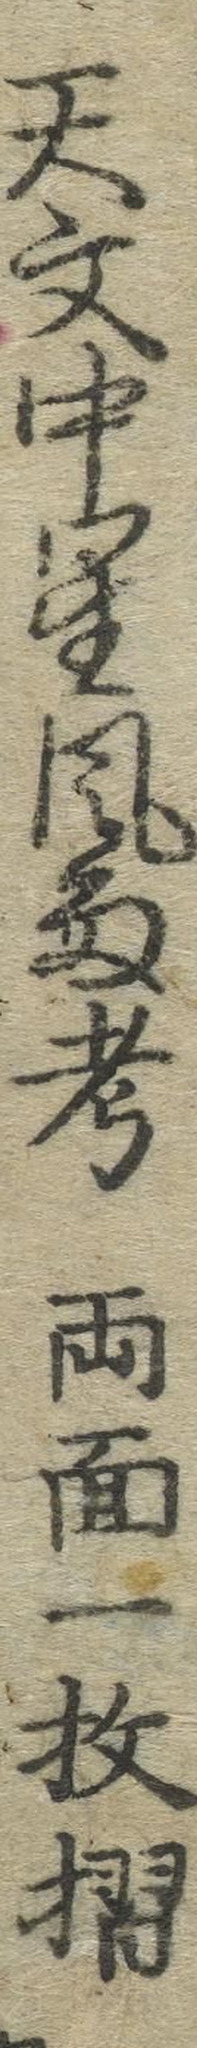天文中星風雨考両面一枚摺
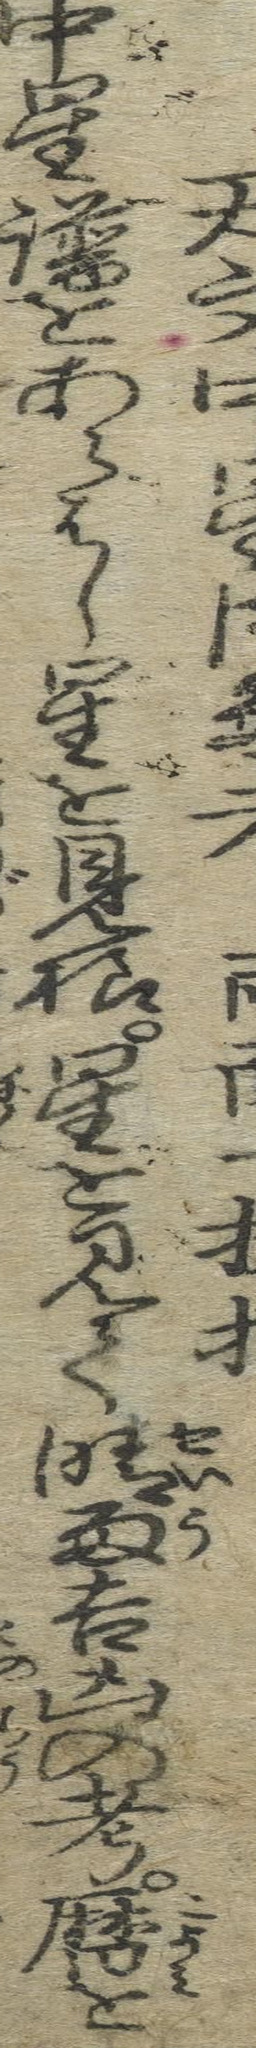中星譜をあらはし星を見様。星を見て晴雨吉凶の考。暦を
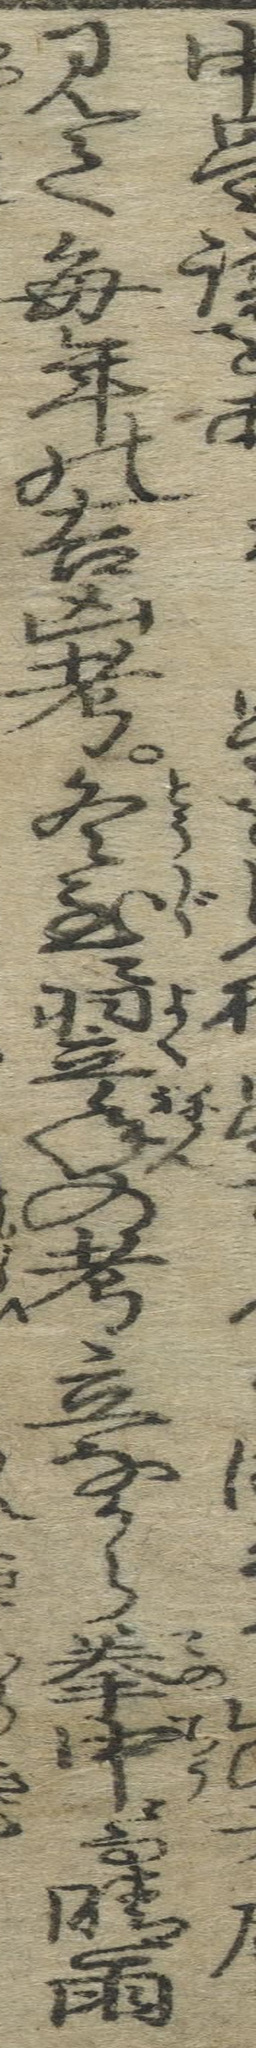見て毎年の吉凶考。冬至翌年の考立なから拳中にて晴雨
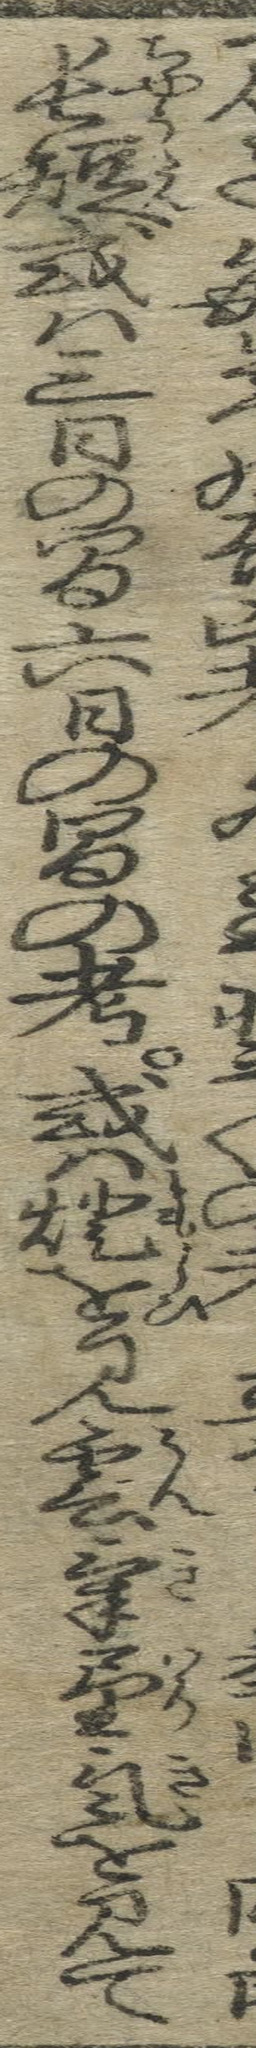長短或は三日の間六日の間の考。或は燈を見雲気望気を見て
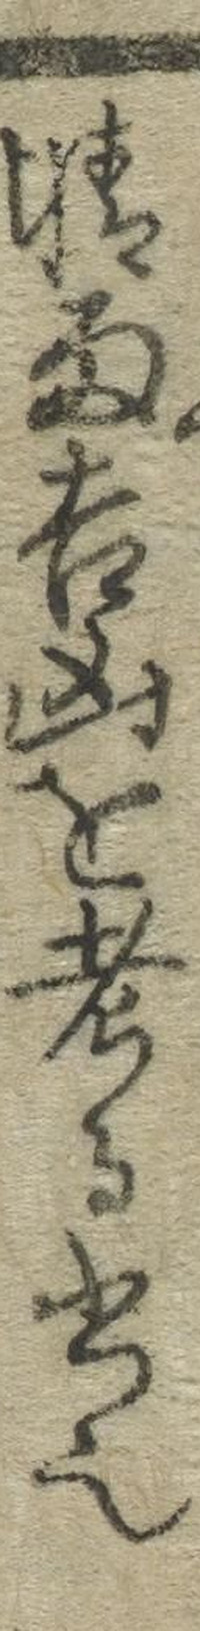晴雨吉凶を考る書也
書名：[晴雨考]
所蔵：東京大学地震研究所図書室 Earthquake Research Institute Library, The University of Tokyo, JAPAN
